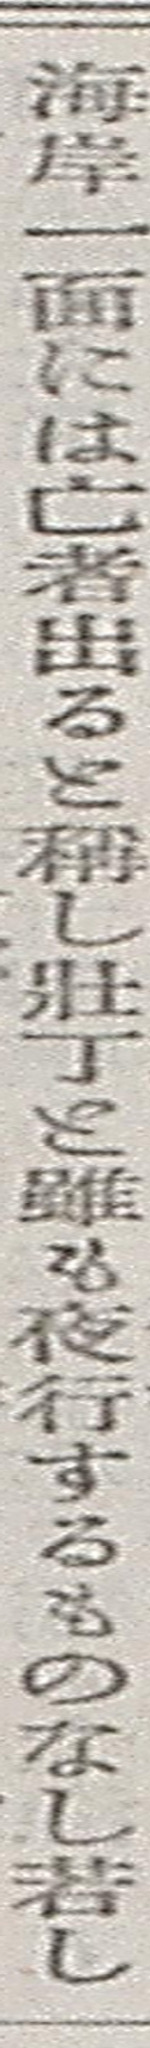海岸一面には亡者出ると称し壮丁と雖も夜行するものなし若し
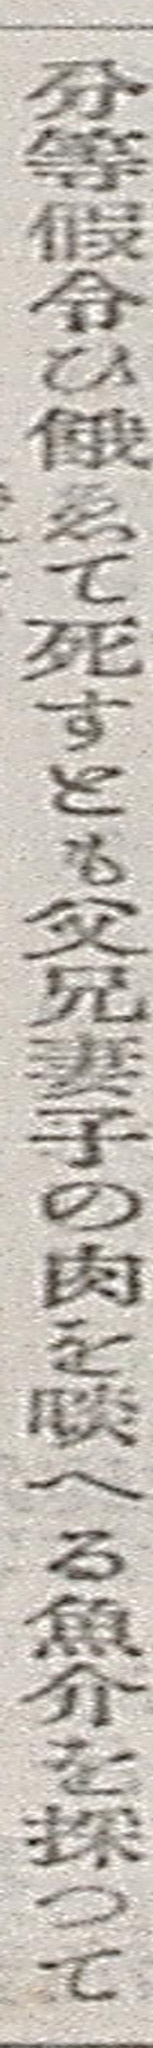分等仮令ひ餓ゑて死すとも父兄妻子の肉を啖へる魚介を採って
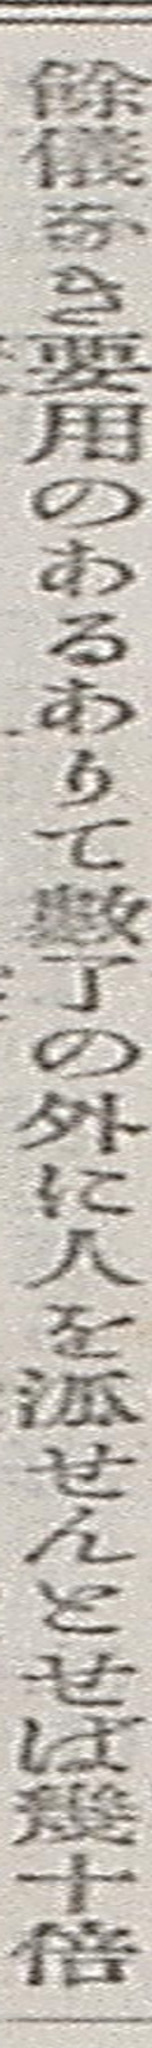余儀なき要用にあるありて数了の外に人を派せんとせば幾十倍
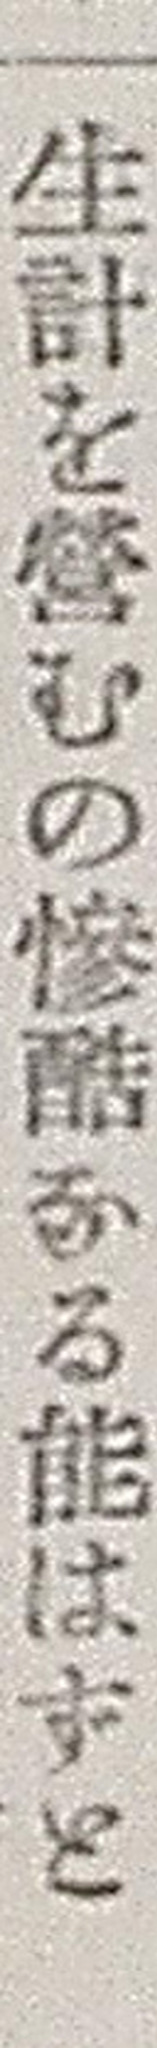生計を営むの惨酷なる能はずと
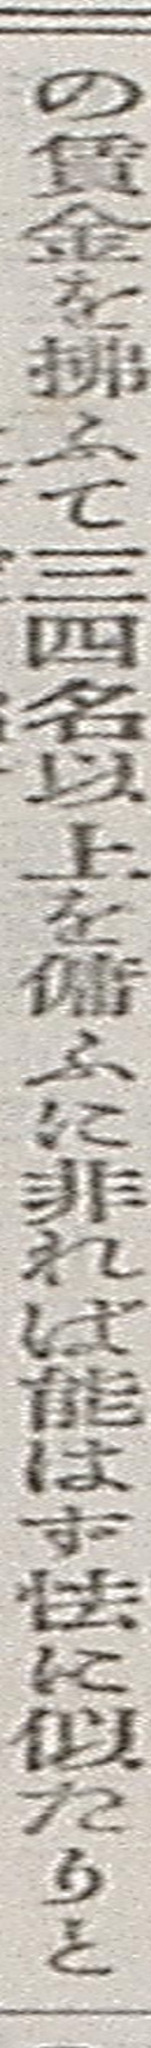の賃金を払ふて三四名以上を傭ふに非れば能はず怯に似たりと
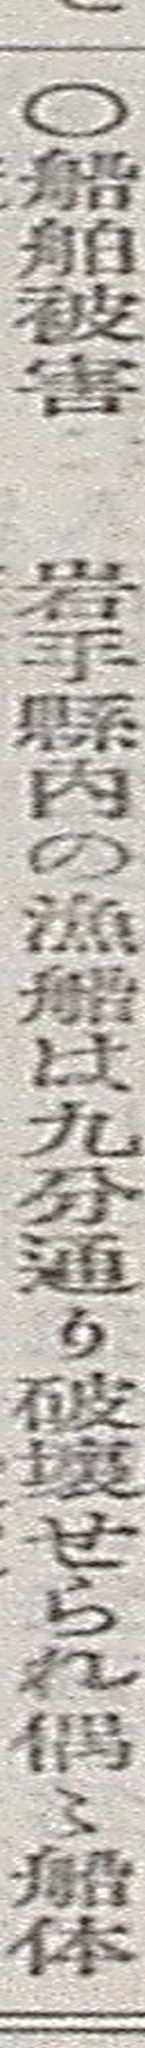○船舶被害岩手県内の漁船は九分通り破壊せられ偶々船体
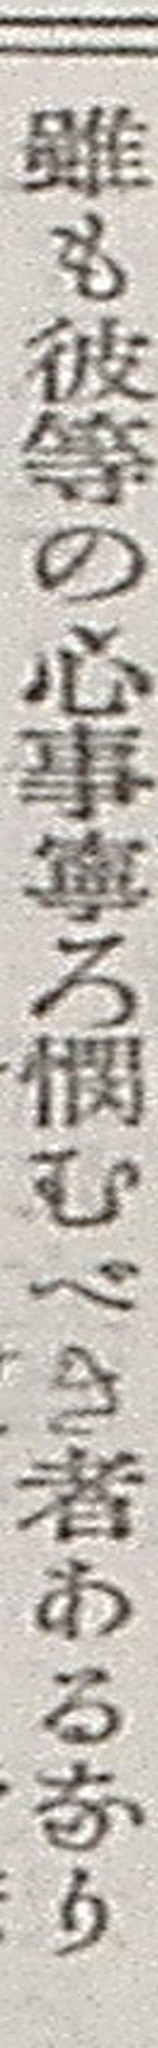雖も彼等の心事寧ろ憫むべき者あるなり
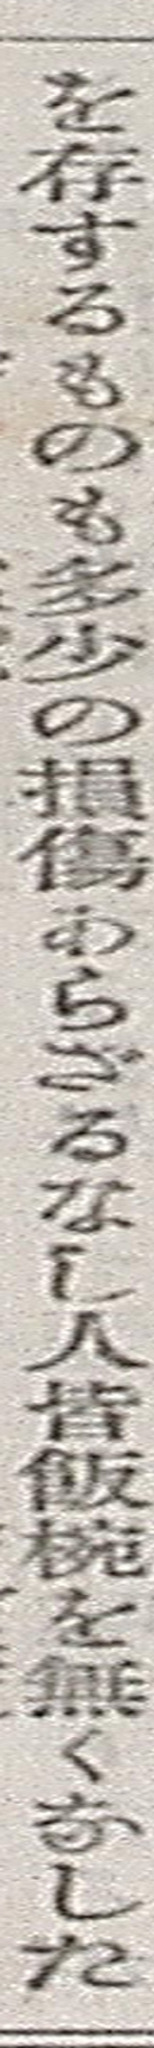を存するものも多少の損傷あらざるなし人皆飯椀を無くなした
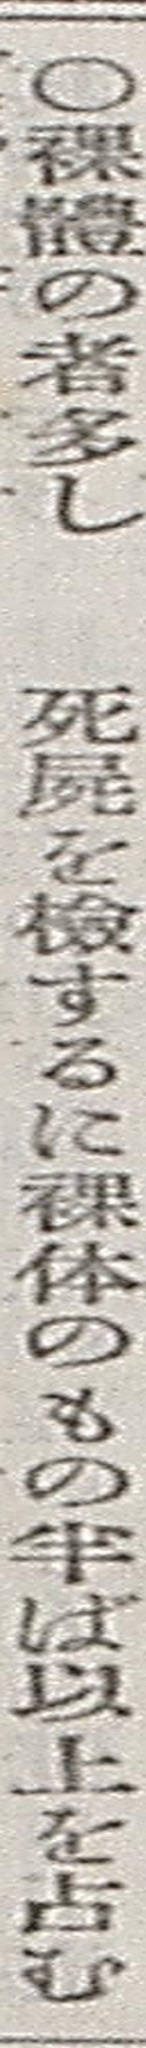○裸体の者多し死屍を検するに裸体のもの半ば以上を占む
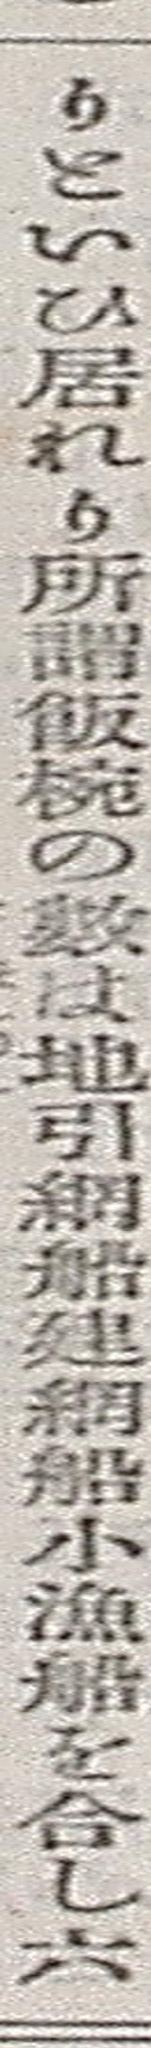りといひ居れり所謂飯椀の数は地引網船建網船小漁船を合し六
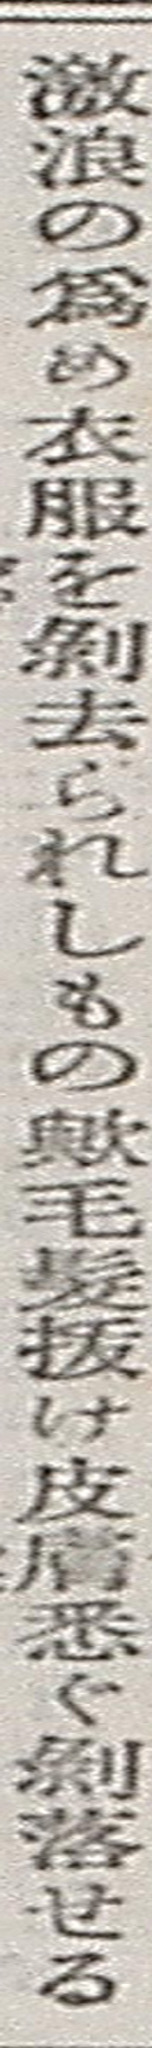激浪の為め衣服を剥去られしもの歟毛髪抜け皮膚悉ぐ剥落せる
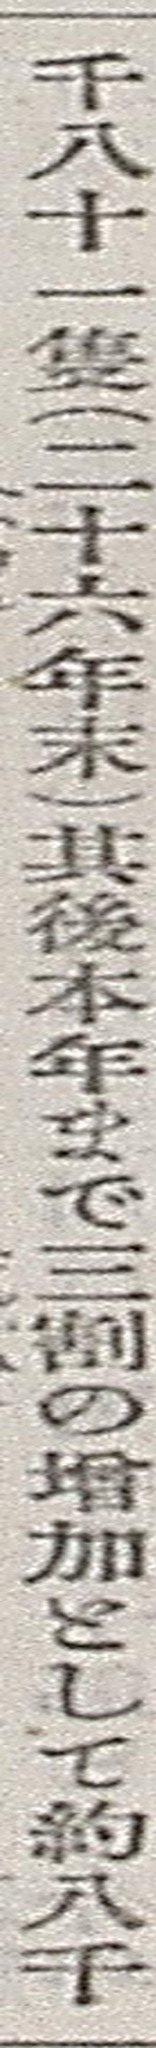千八十一隻其後本年まで三割の増加として約八千
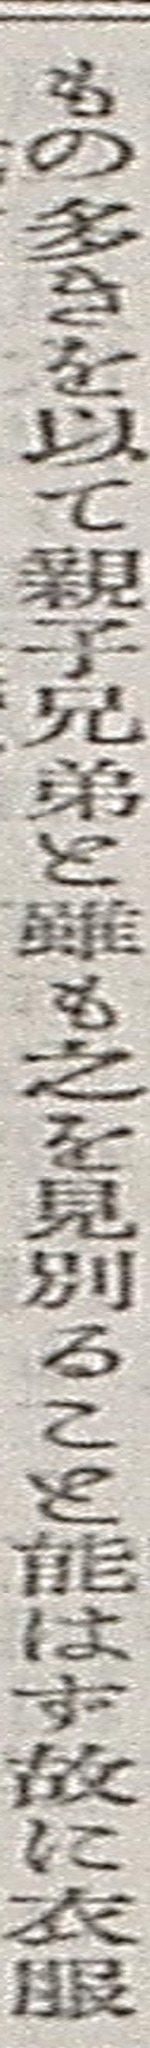もの多きを以て親子兄弟と雖も之を見別ること能はず故に衣服
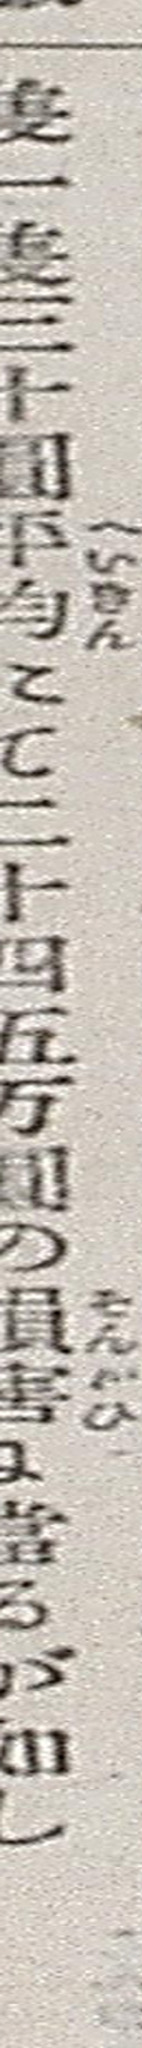隻一隻三十円平均にて二十四五万円の損害に当るが如し
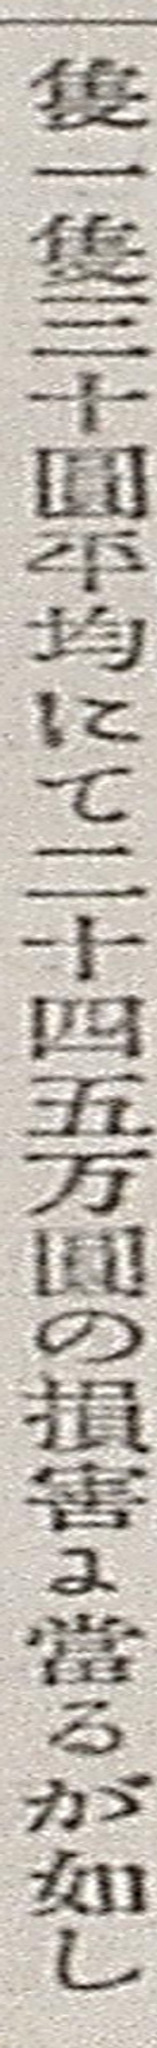隻一隻三十円平均にて二十四五万円の損害に当るが如し
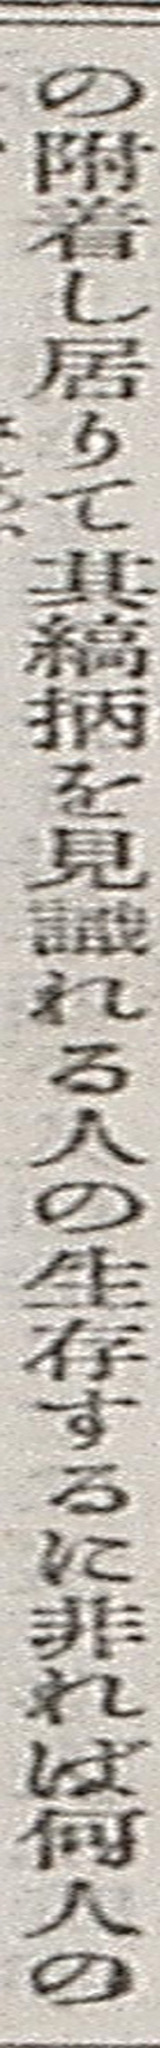の付着し居りて其縞柄を見識れる人の生存するに非れば何人の
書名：風俗畫報臨時増刊第百二十號　大海嘯被害録（下）
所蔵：東京大学地震研究所図書室 Earthquake Research Institute Library, The University of Tokyo, JAPAN
